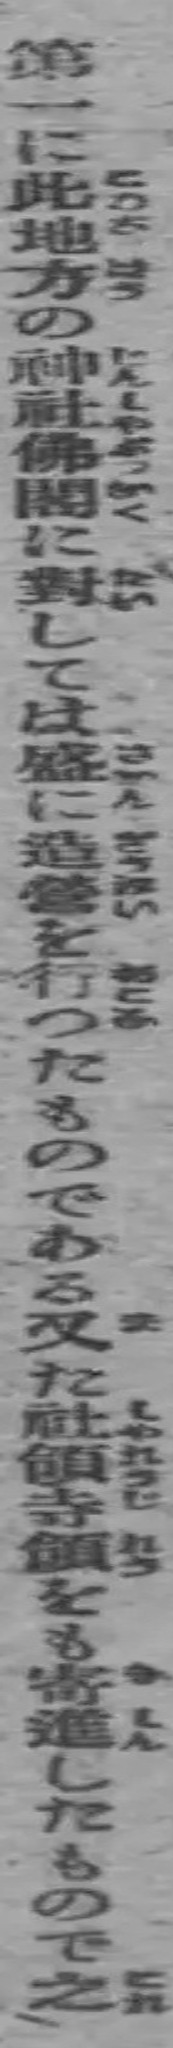第一に此地方の神社仏閣に対しては盛に造営を行つたものである又た社領寺領をも寄進したもので之
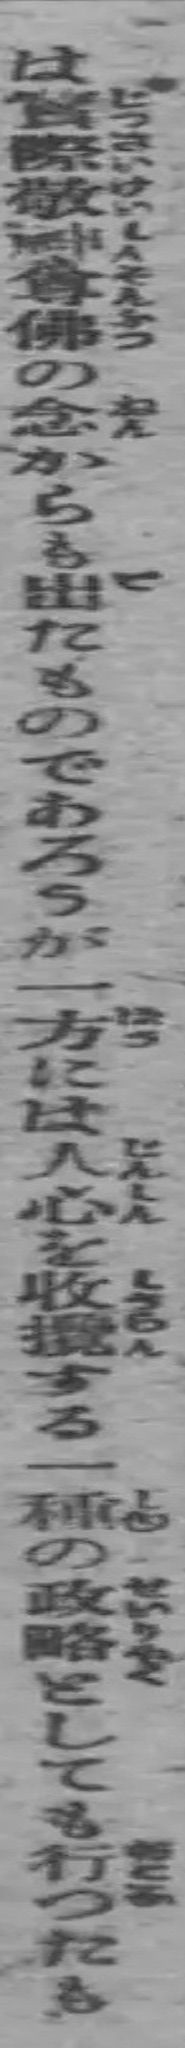は実際敬神尊仏の念からも出たものであろうが一方には人心を収攬する一種の政略としても行つたも
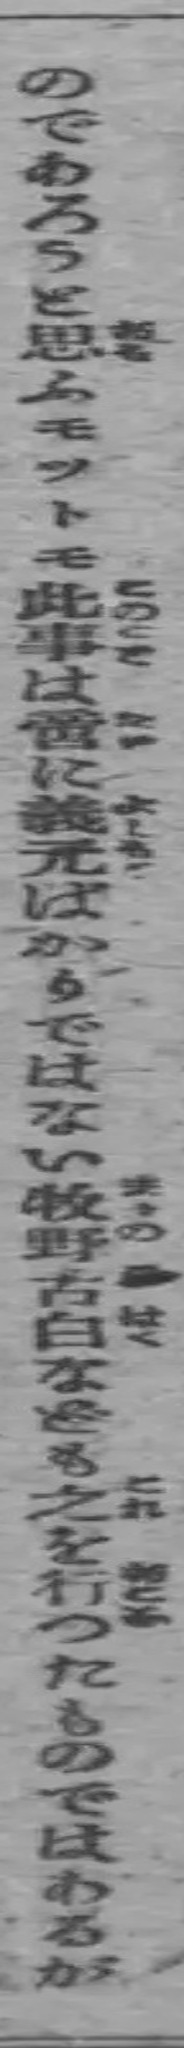のであろうと思ふモツトモ此事は啻に義元ばかりではない牧野古白なども之を行つたものではあるが
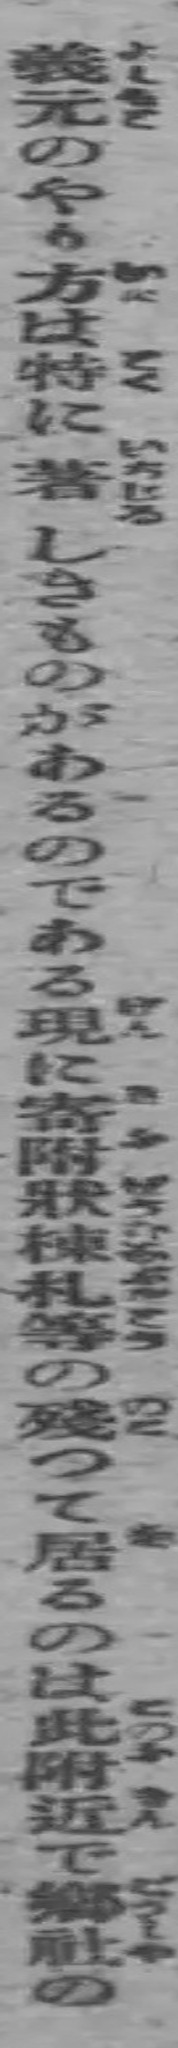義元のやり方は特に著しきものがあるのである現に寄附状棟札等の残つて居るのは此附近で郷社の
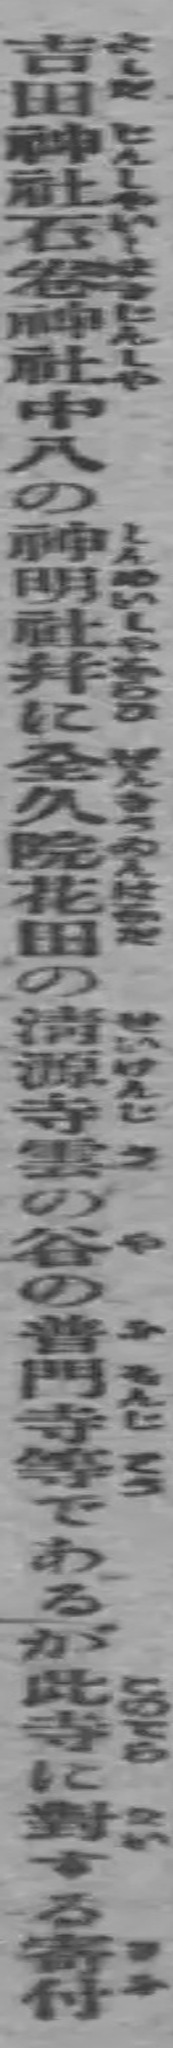吉田神社石巻神社中八の神明社幷に全久院花田の清源寺雲の谷の普門寺等であるが此寺に対する寄付
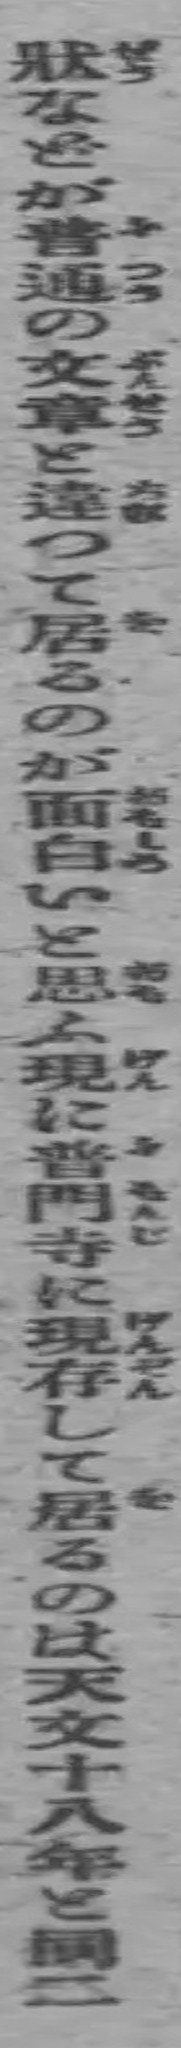状などが普通の文章と違つて居るのが面白いと思ふ現に普門寺に現存して居るのは天文十八年と同二
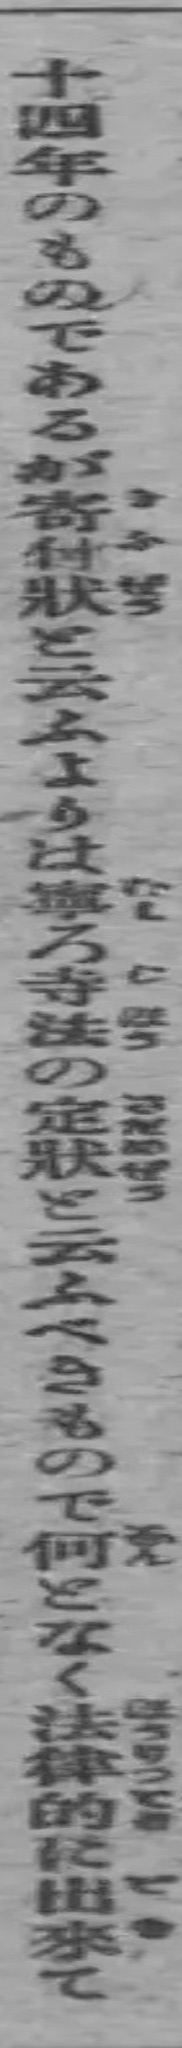十四年のものであるが寄付状と云ふよりは寧ろ寺法の定状と云ふべきもので何となく法律的に出来て
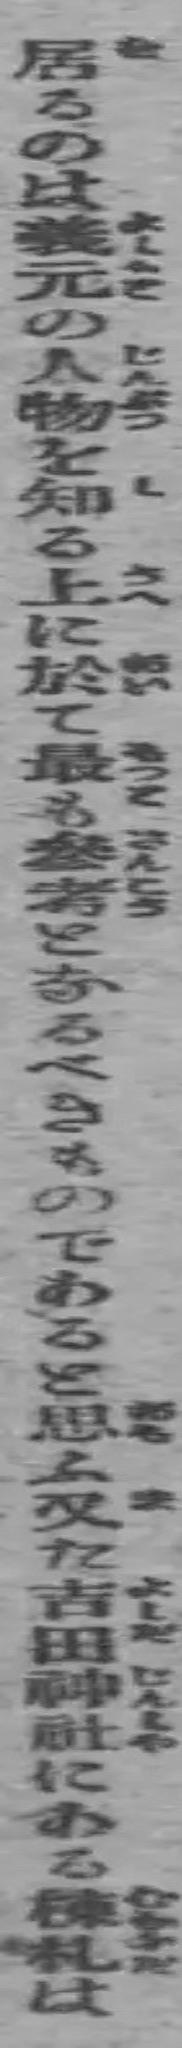吉田神社居るのは義元の人物を知る上に於て最も参考となるべきものであると思ふ又た吉田神社にある棟札は
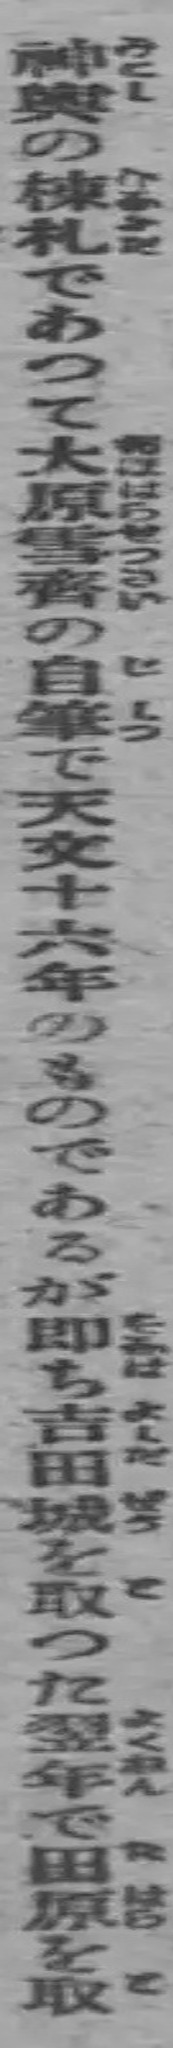神輿の棟札であつて大原雪斎の自筆で天文十六年のものであるが即ち吉田城を取つた翌年で田原を取
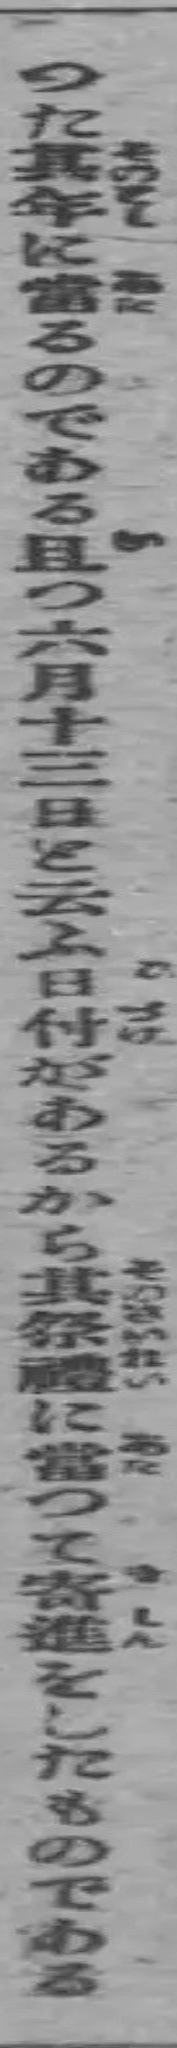つた其年に当るのである且つ六月十三日と云ふ日付があるから其祭礼に当つて寄進をしたものである
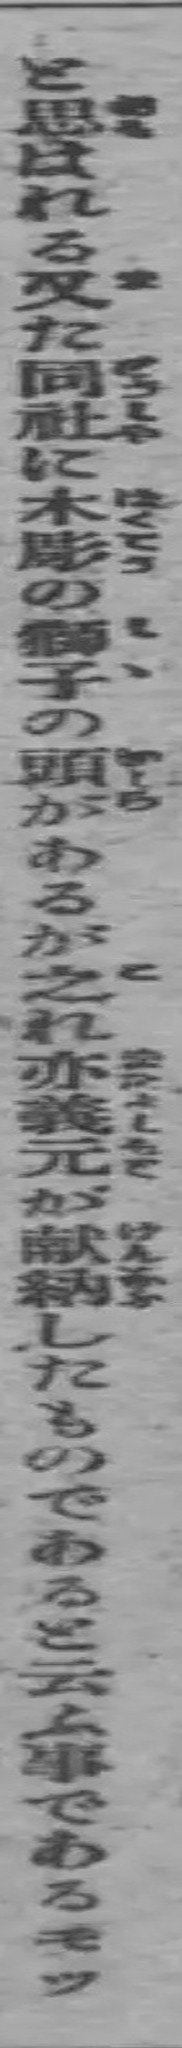と思はれる又た同社に木彫の獅子の頭があるが之れ亦義元が献納したものであると云ふ事であるモツ
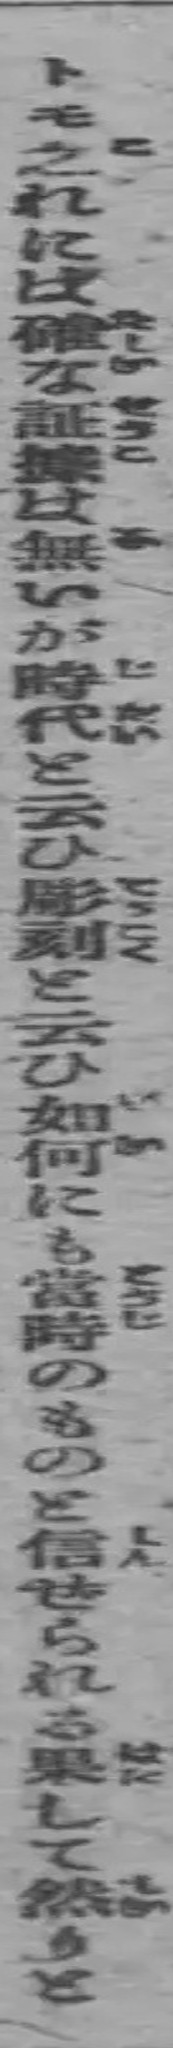トモ之れには確な証拠は無いが時代と云ひ彫刻と云ひ如何にも当時のものと信ぜられる果して然りと
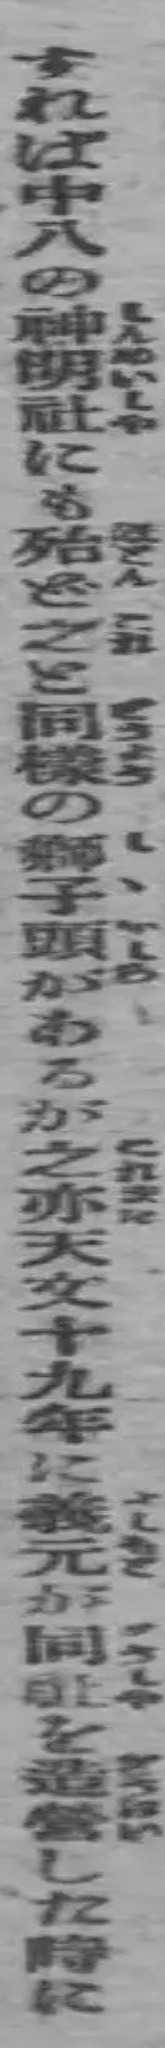すれば中八の神明社にも殆ど之と同様の獅子頭があるが之亦天文十九年に義元が同社を造営した時に
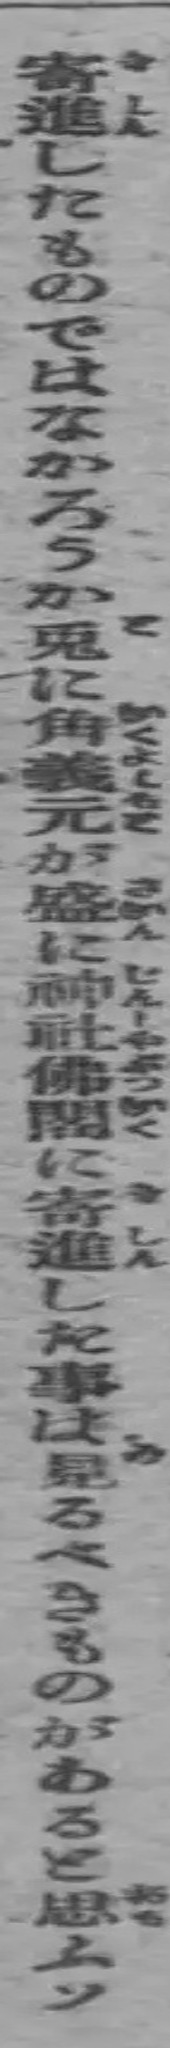寄進したものではなかろうか兎に角義元が盛に神社仏閣に寄進した事は見るべきものがあると思ふソ

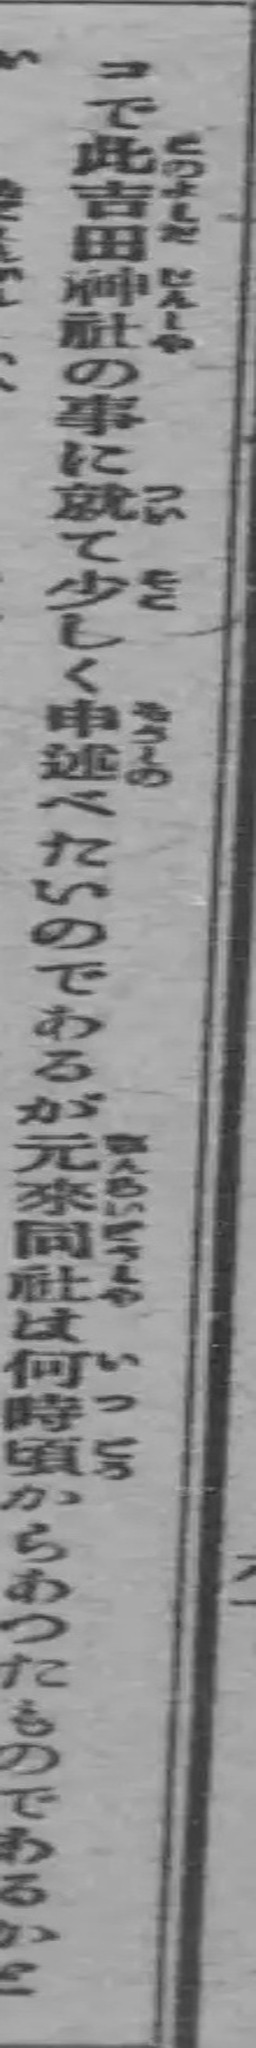コで此吉田神社の事に就て少しく申述べたいのであるが元来同社は何時頃からあつたものであるかと
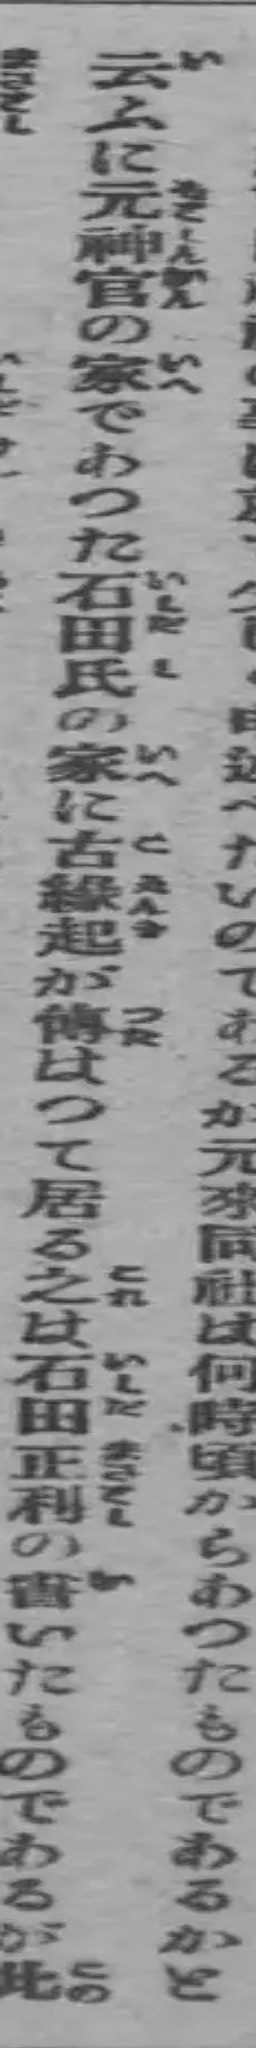石田正利云ふに元神官の家であつた石田氏の家に古縁起が伝はつて居る之は石田正利の書いたものであるが此
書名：豊橋市史談
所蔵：国立国会図書館 National Diet Library, JAPAN
